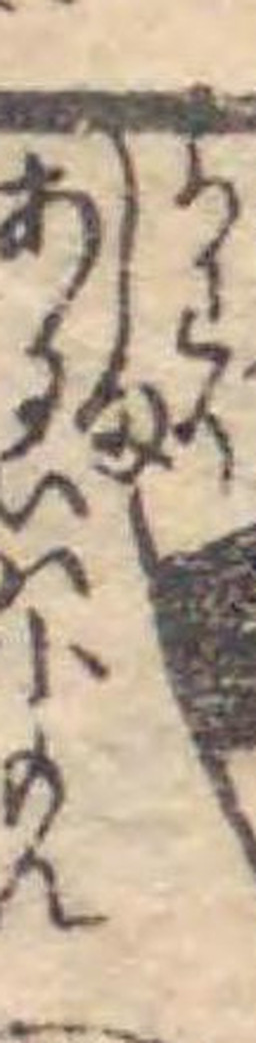あるいは小もん
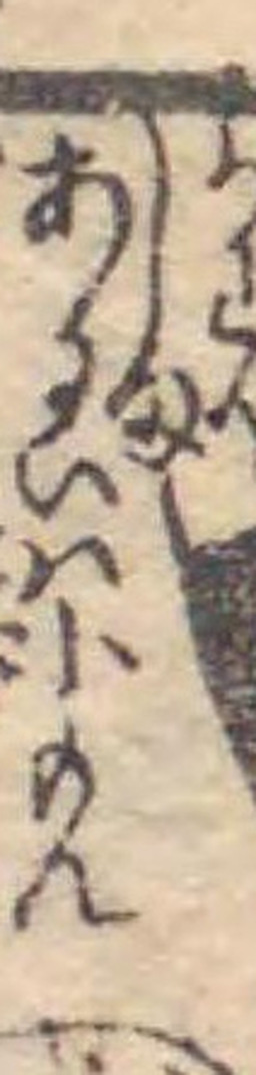あるいは小もん
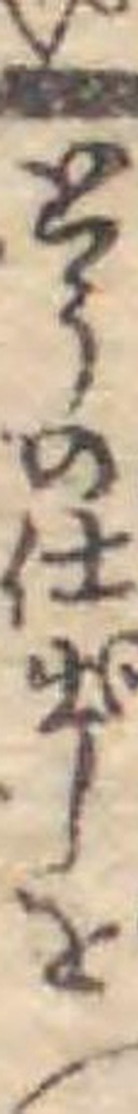とうの仕出しを
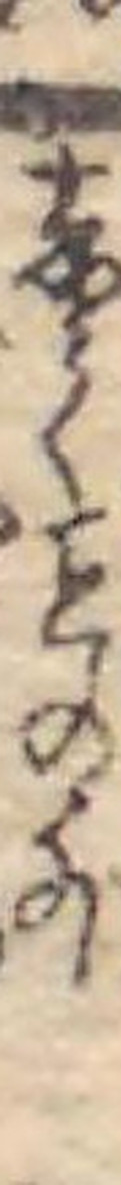してことの外
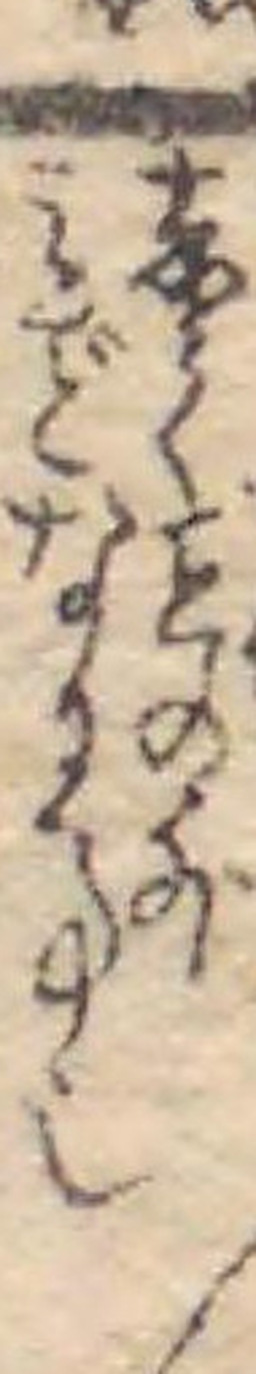みごとなる事也
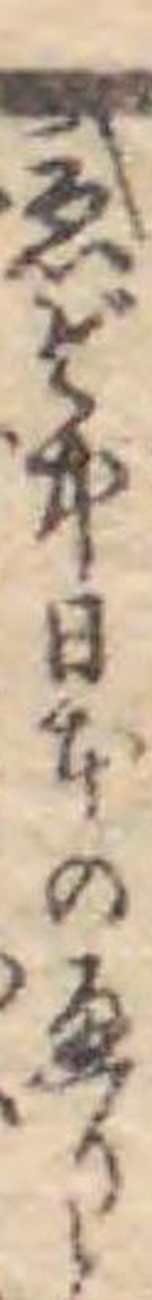〽ゑぞ中日本の通りと
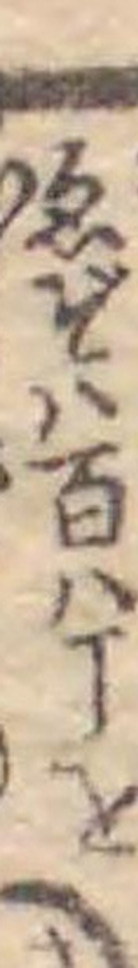ゑぞ八百八丁を
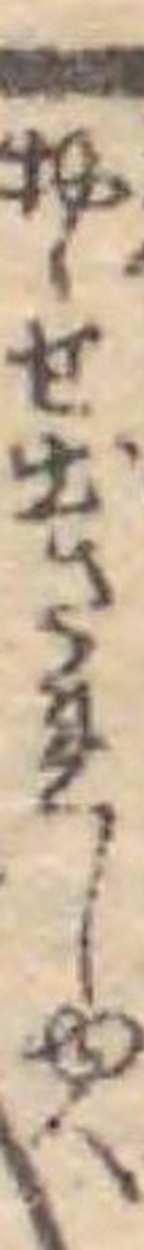おゝせ出されしゆへ
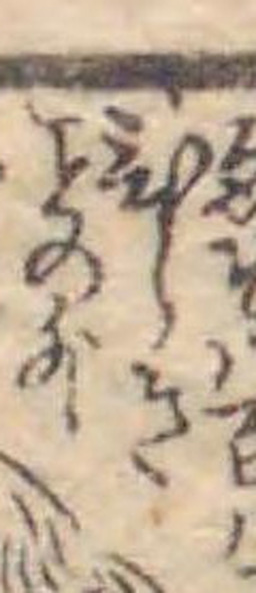ことの外
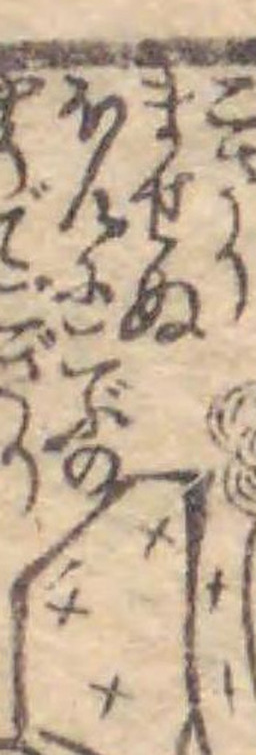ほんにこぶの
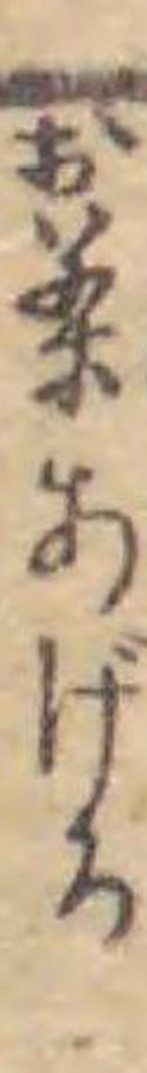お茶あげろ

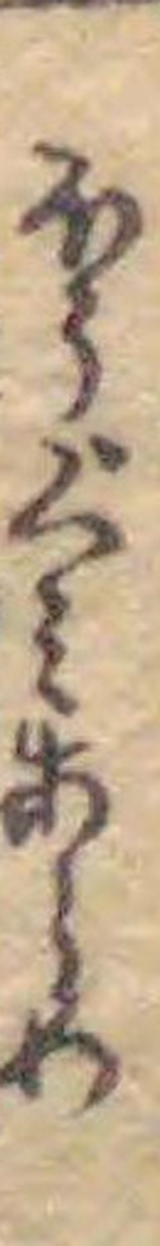ほうぐみあらめ
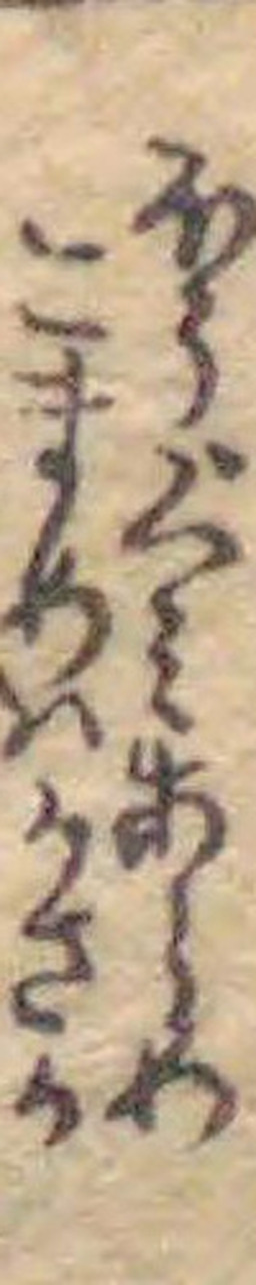こまめはかさか
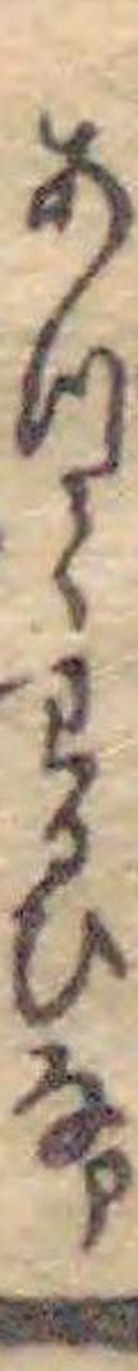あつてわるひなァ
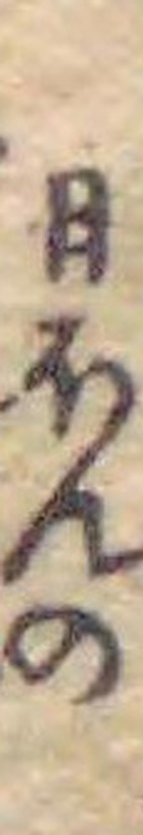日ほんの
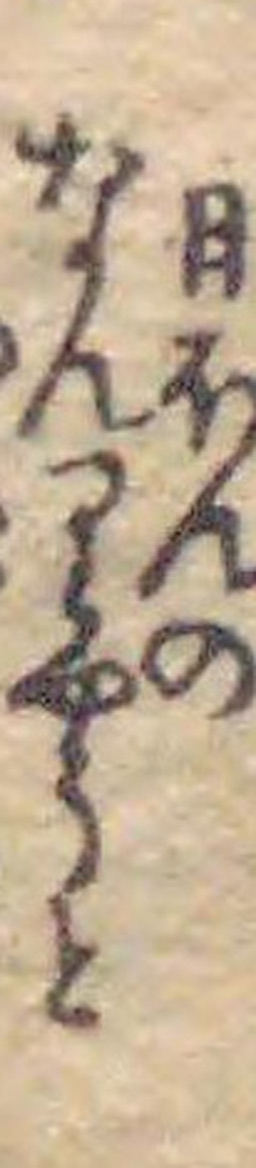なんりやうと
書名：悦贔負蝦夷押領 : 3巻
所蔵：国立国会図書館 National Diet Library, JAPAN
